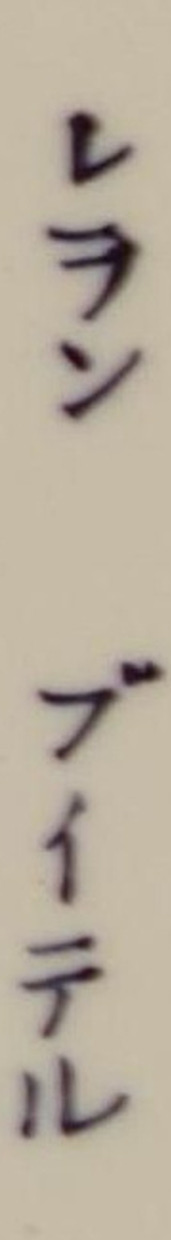レヲンブイテル
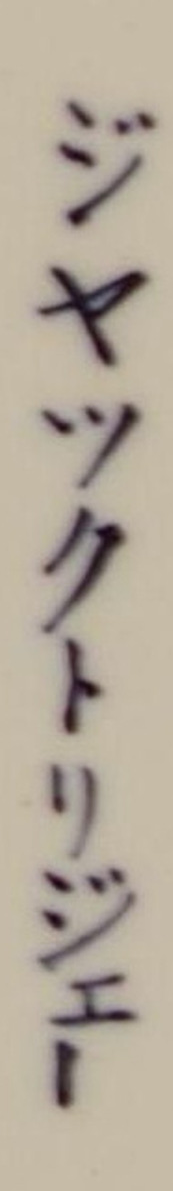ジャックトリジェー
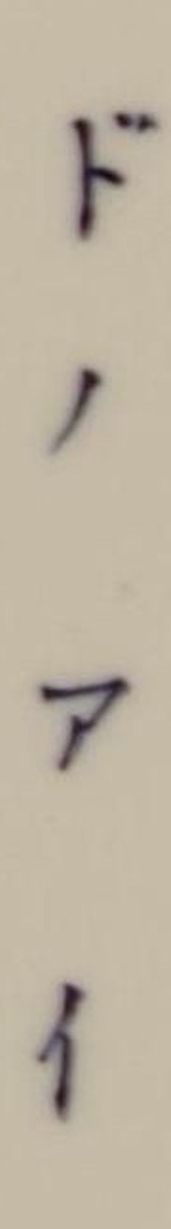ドノアイ
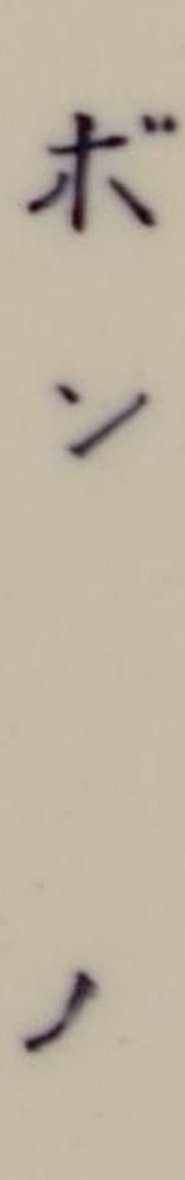ボンノ
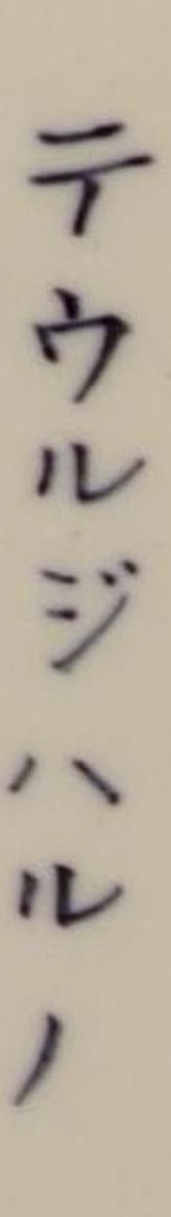テウルジハルノ
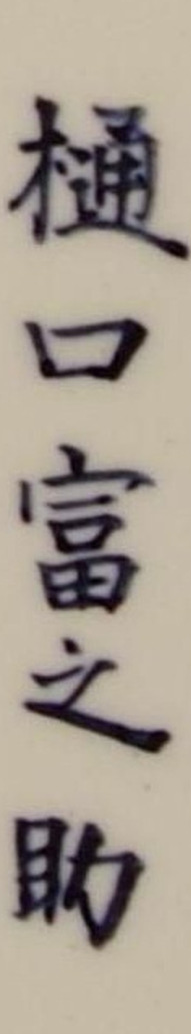樋口富之助
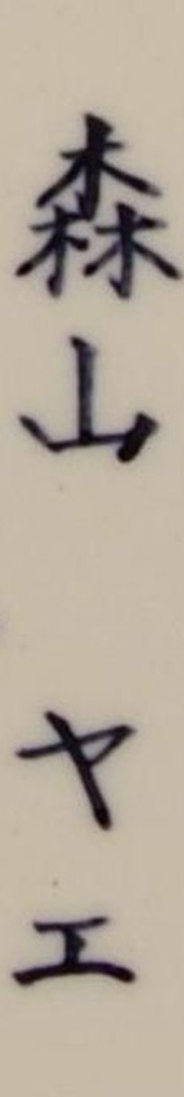森山ヤエ
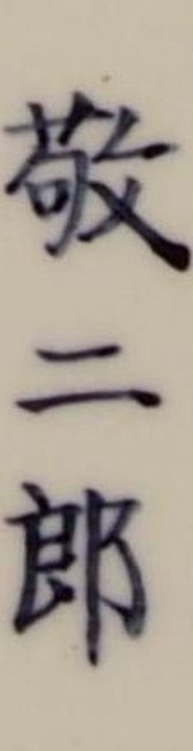敬二郎
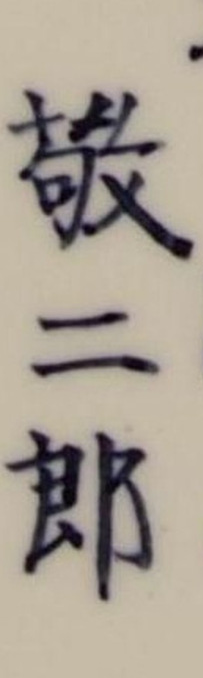敬二郎
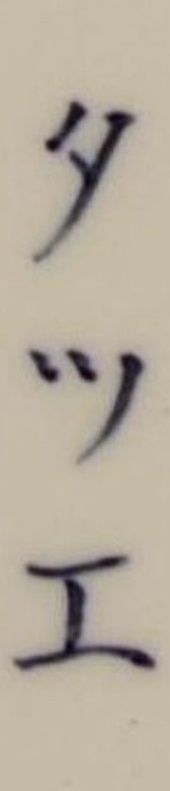タツエ
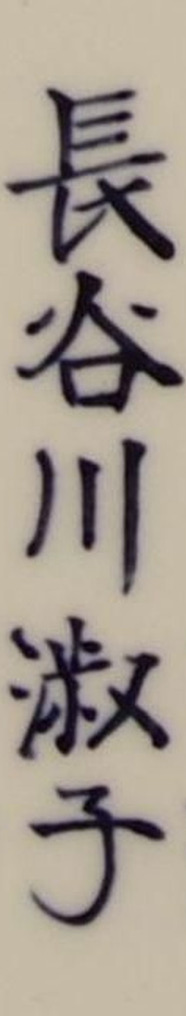長谷川淑子
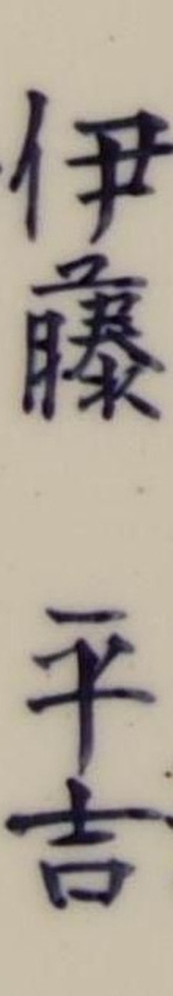伊藤平吉
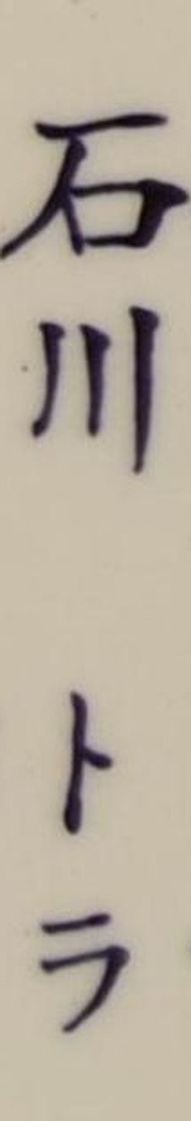石川トラ
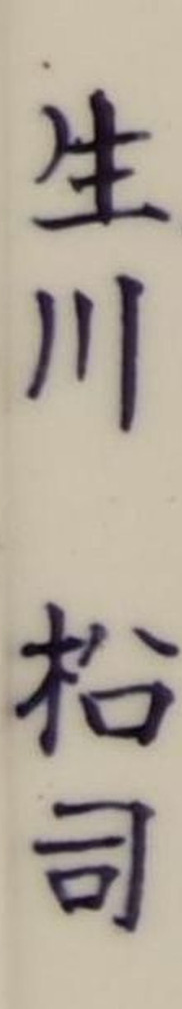生川松司

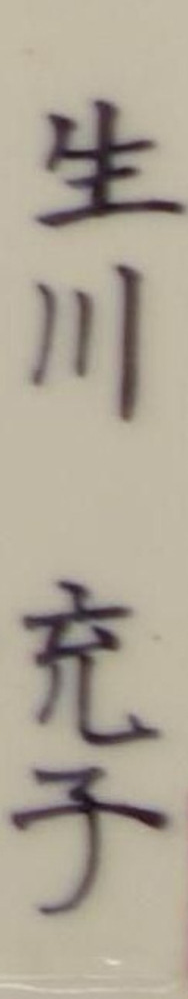生川充子
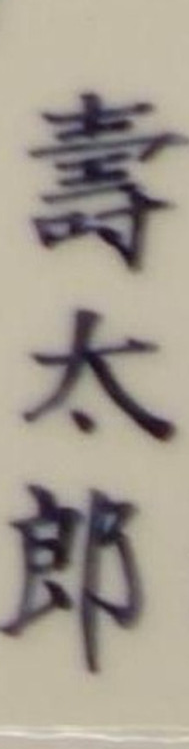寿太郎
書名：M~S
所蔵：高野山金剛峯寺
